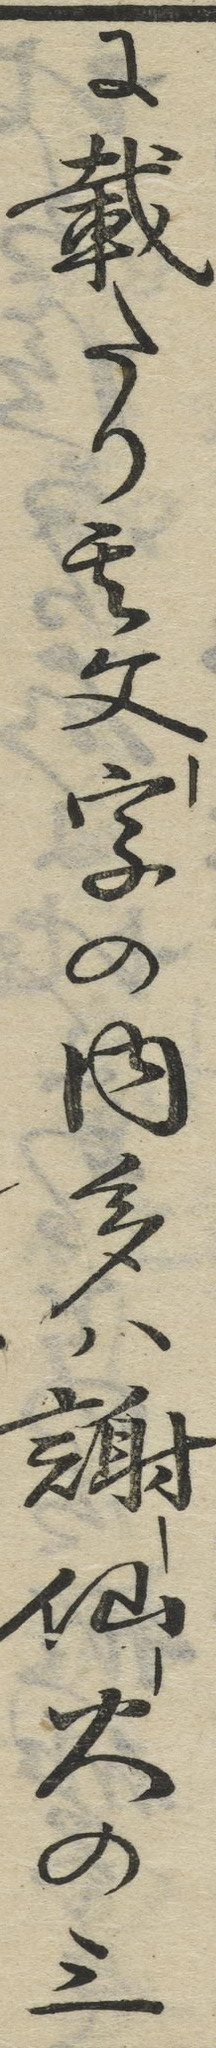に載たり其文字の内多ハ謝ノ仙ノ火の三
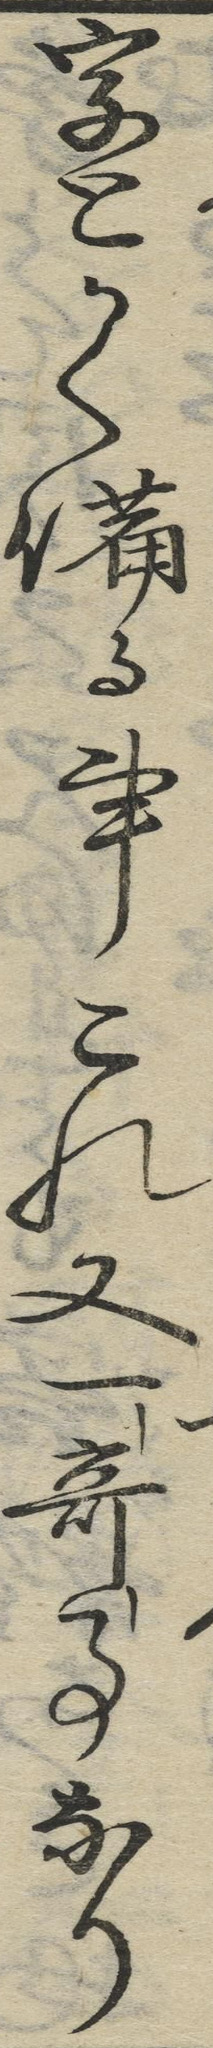字とく備る事これ又一ノ奇ノ事なり
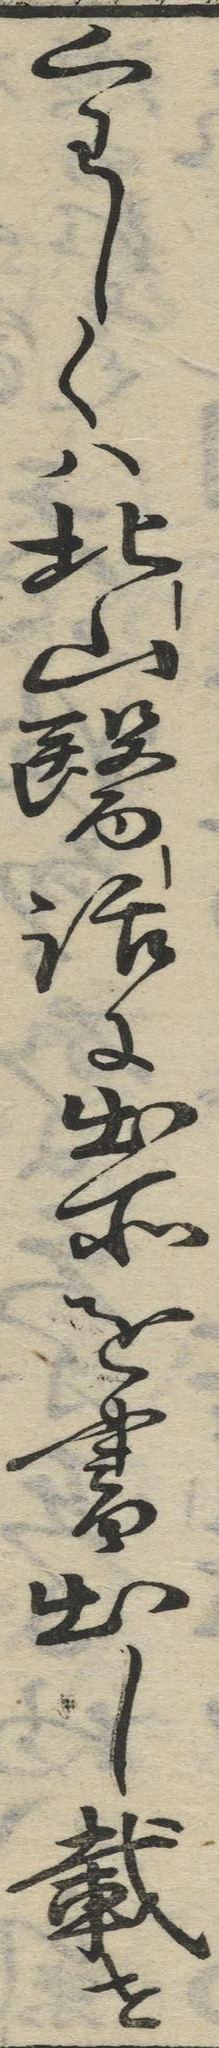くわしくハ北ノ山医ノ話に出所を書出し載せ
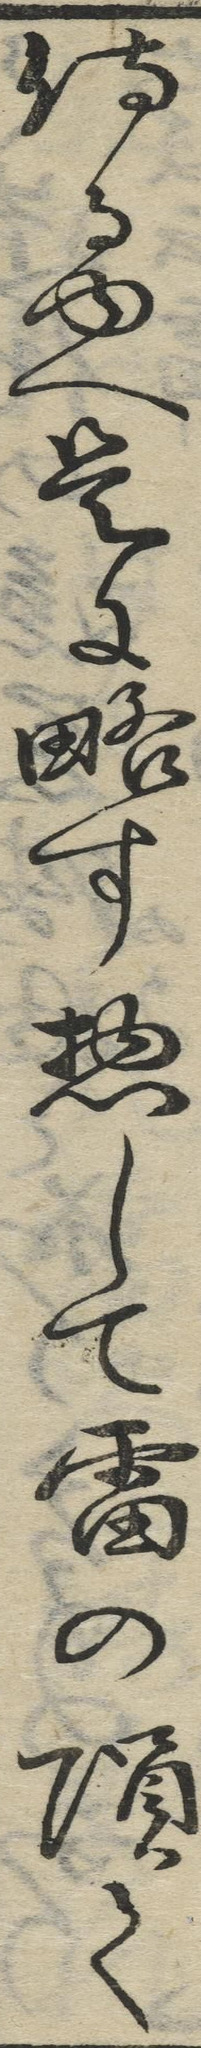侍るゆへ是に略す惣して雷の隕〳〵
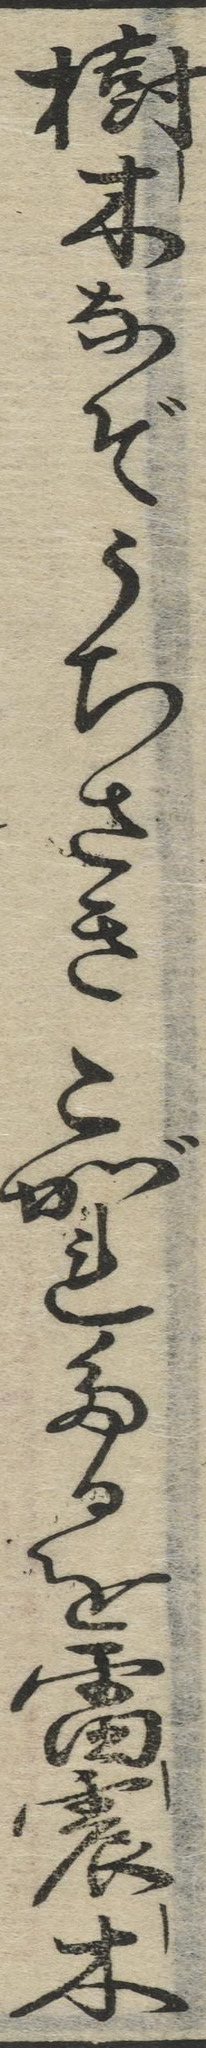樹木なぞうちさきこがれたるを雷ノ震ノ木
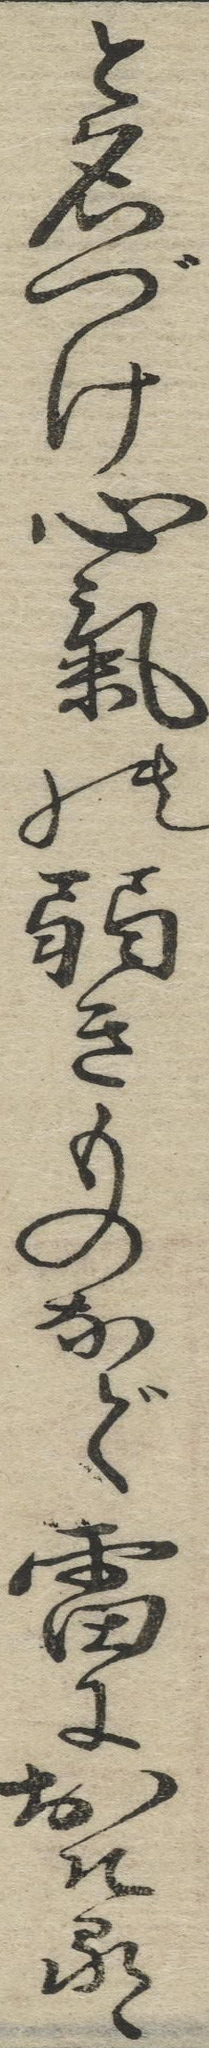と名づけ心気の弱きものなど雷における
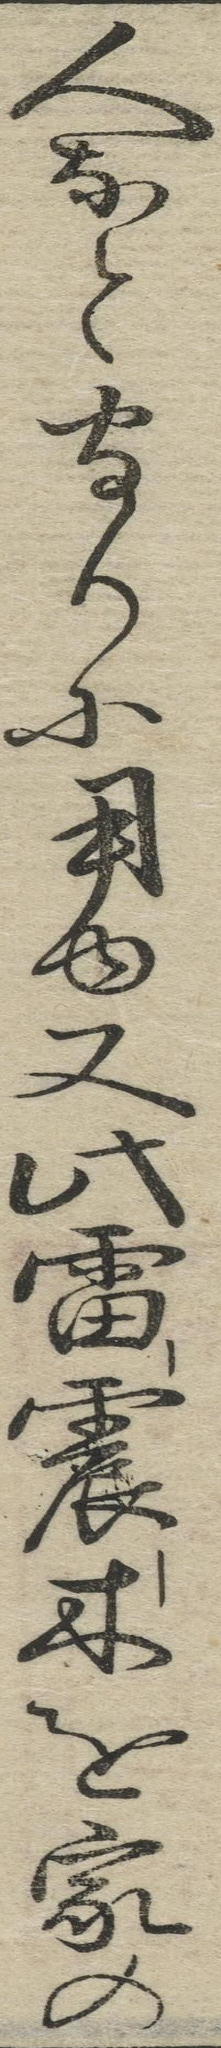人なと守りに用ゆ又此雷震ノ木を家の
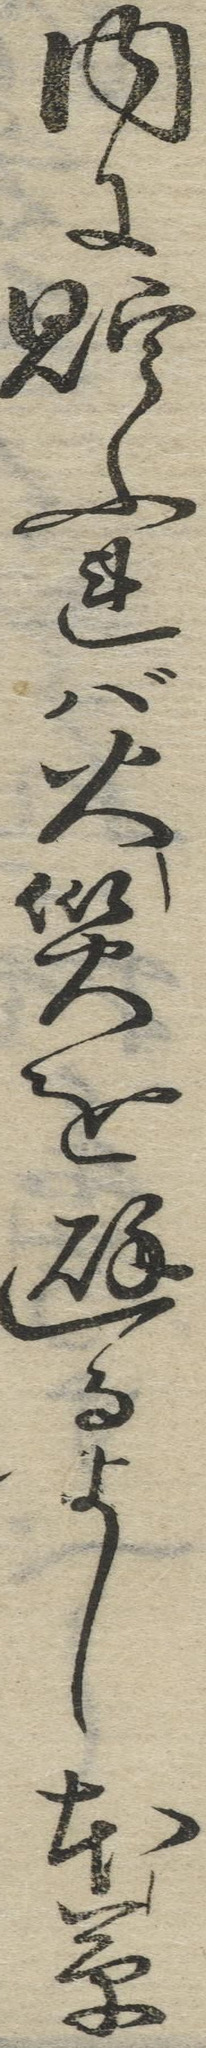内に貯ふれバ火ノ災を避けるよし本草
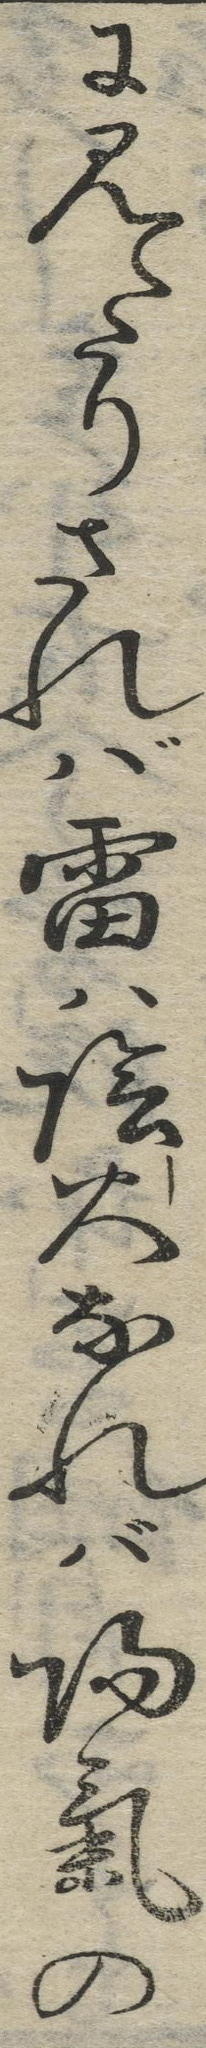に見たりされバ雷ハ陰ノ火なれバ気の
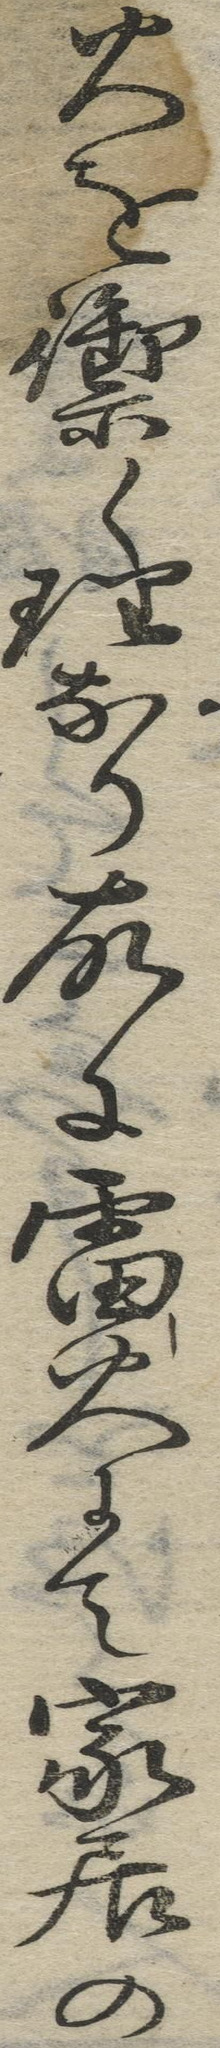火を禦く理なり故に雷火にて家居の
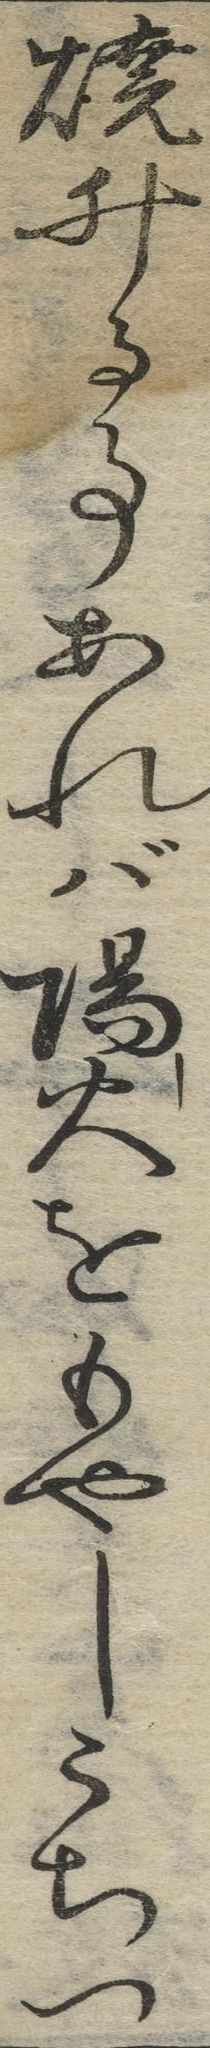焼昇る事あれバ陽火をもやしうちつ
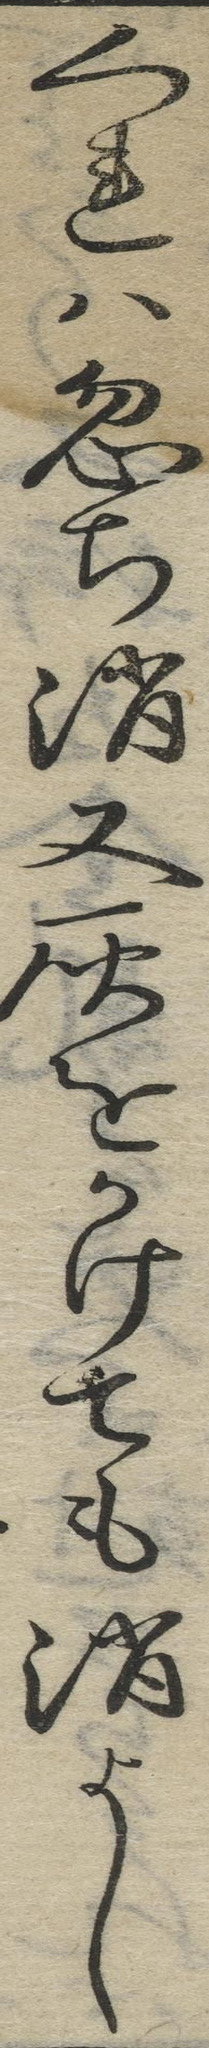くれハ忽ち消又灰をかけても消よし
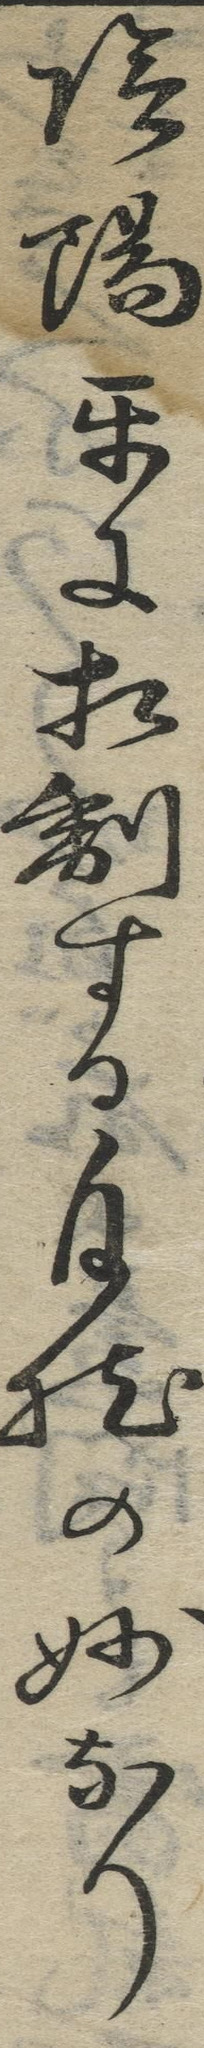陰陽互に相制する自然の妙なり
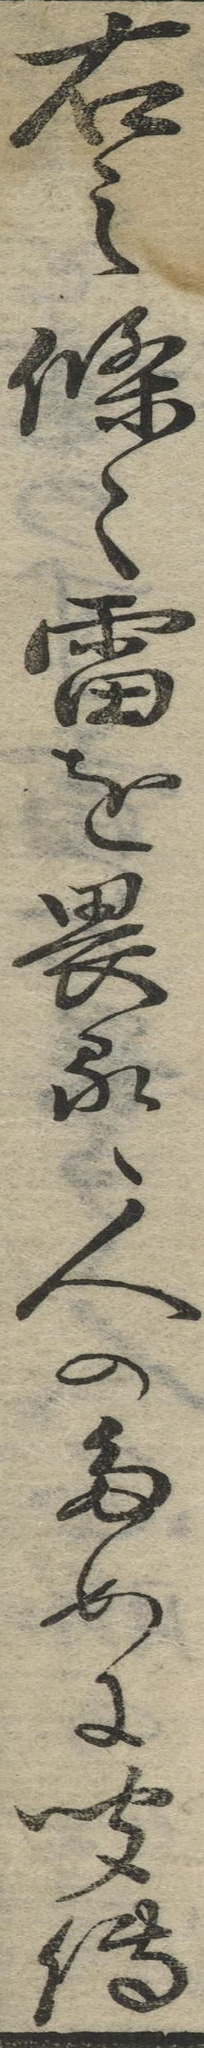右之條々雷を畏るゝ人のために聞伝

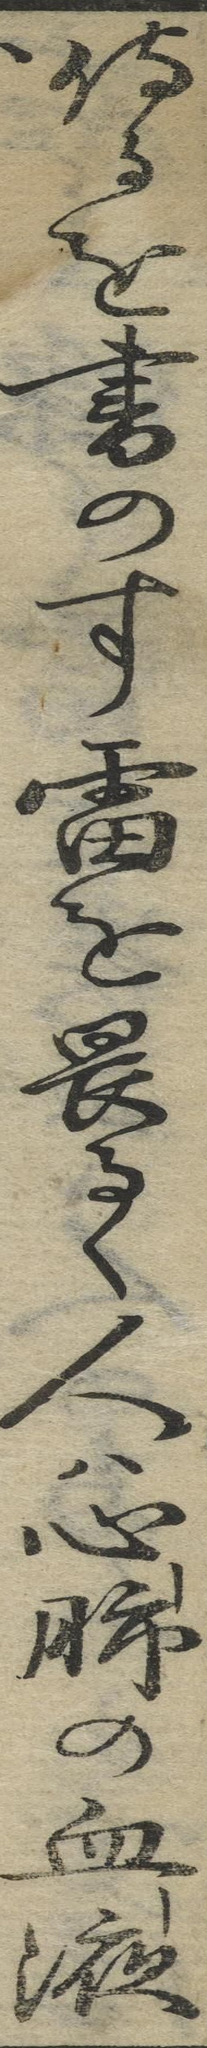傳るを書のす雷を畏るゝ人ハ心ノ肺の血ノ液
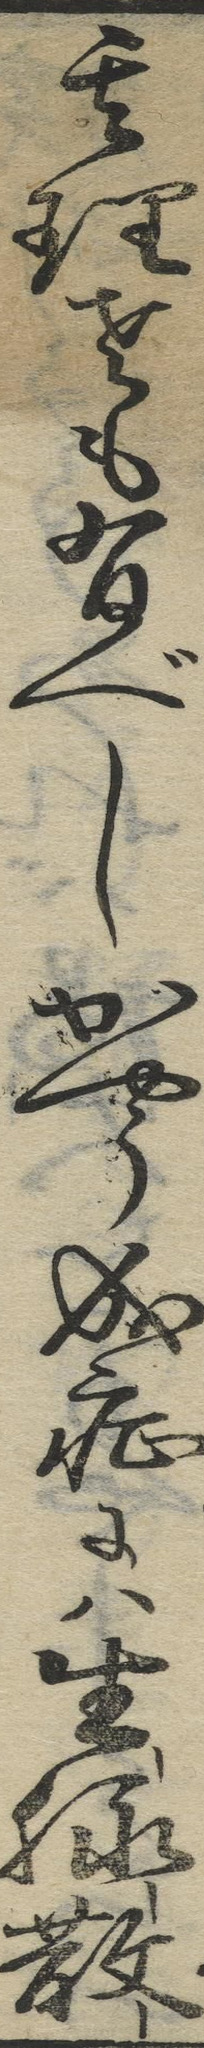其理さも有べしかやう成症にハ生ノ腺ノ散ノ
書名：雷震記　完
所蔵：東京大学地震研究所図書室 Earthquake Research Institute Library, The University of Tokyo, JAPAN
